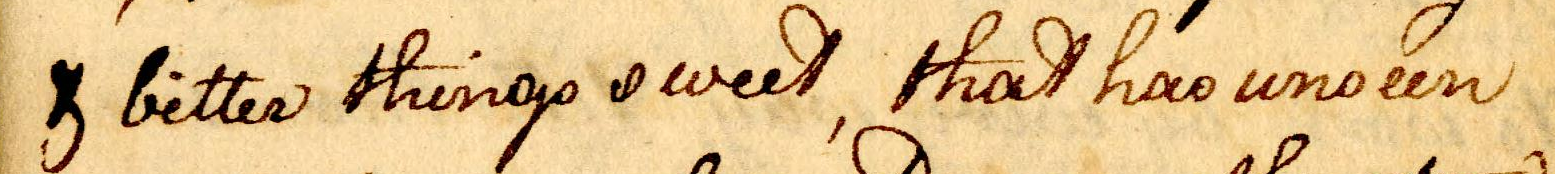& bitter things sweet, that has unseen
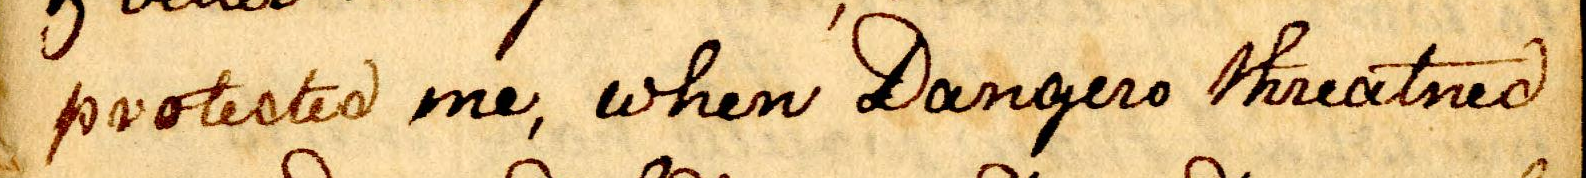protected me, when Dangers threatned
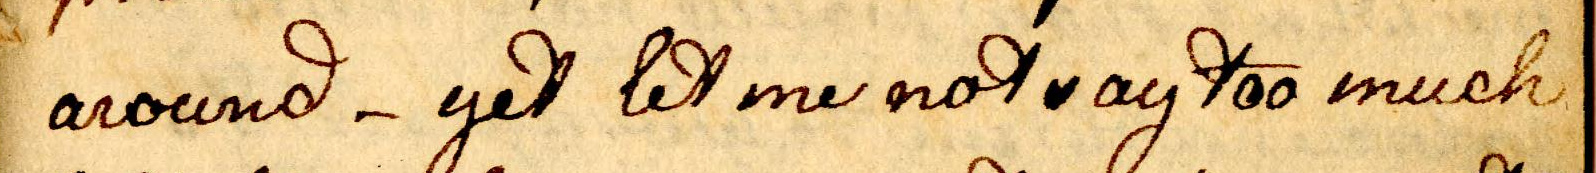around- yet let me not say too much
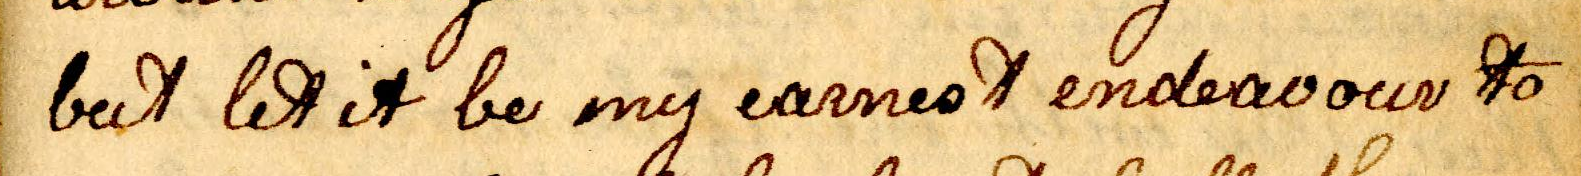but let it be my earnest endeavour to
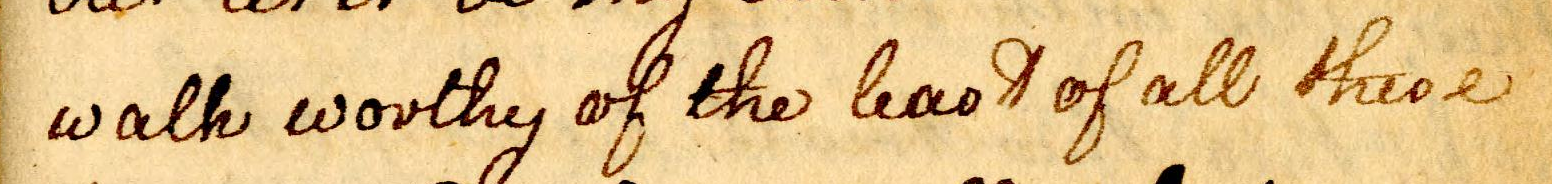walk worthy of the least of all these
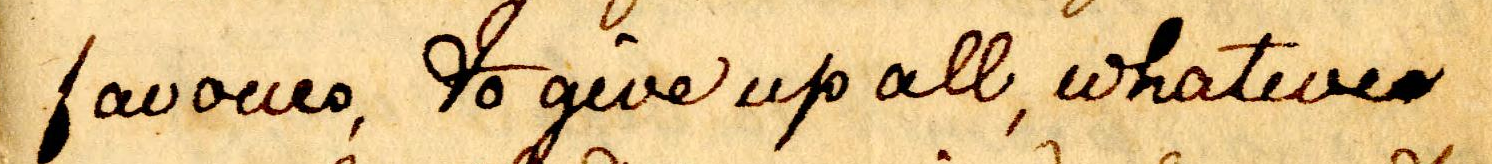favours, to give up all whatever
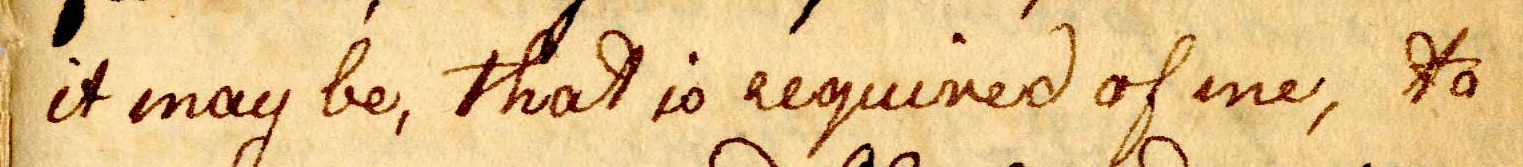it may be, that is required of me, to
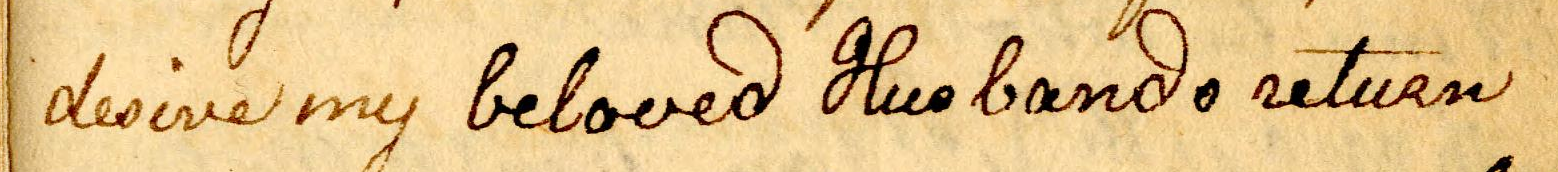desire my beloved Husbands return
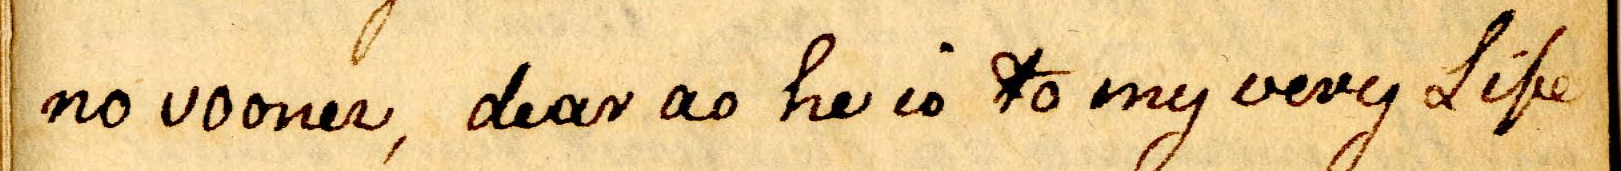no sooner, dear as he is to my very Life
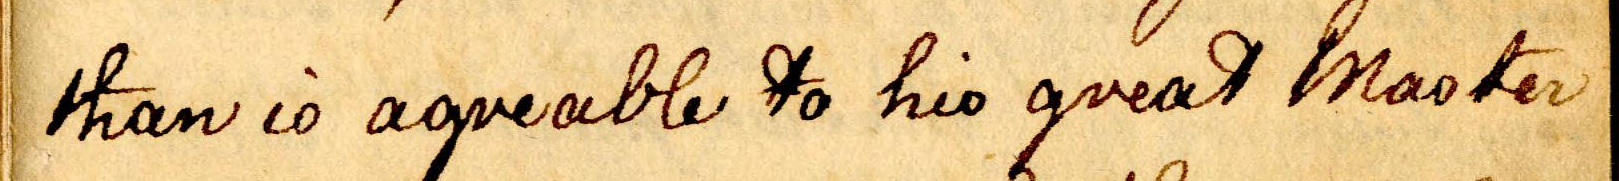than is agreable to his great Master
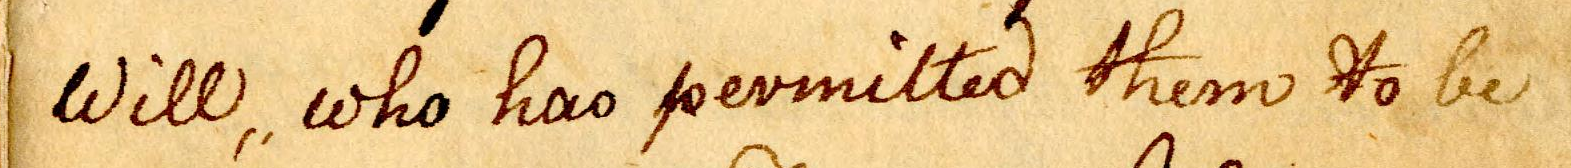Will, who has permitted them to be
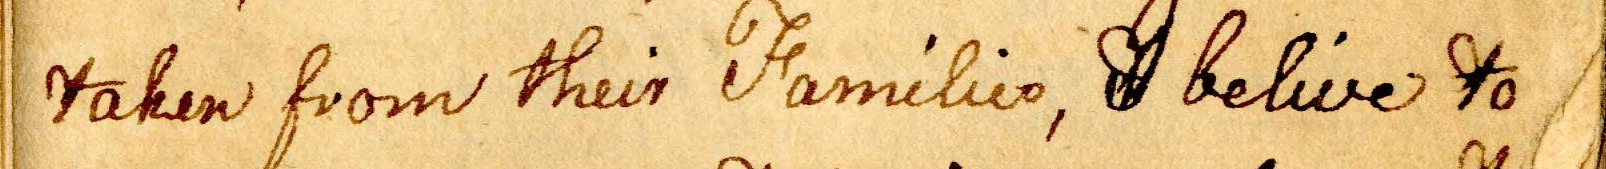taken from their Families, I belive to
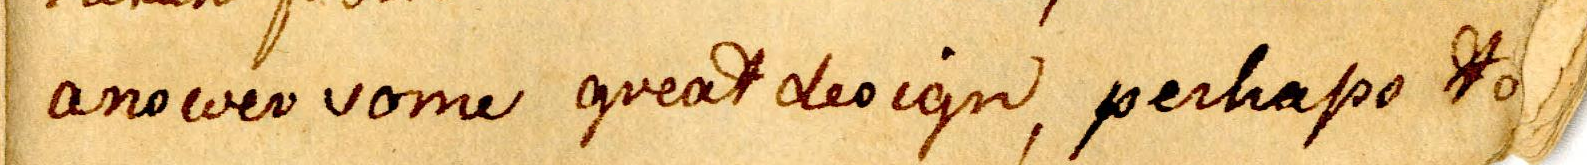answer some great design, perhaps to
